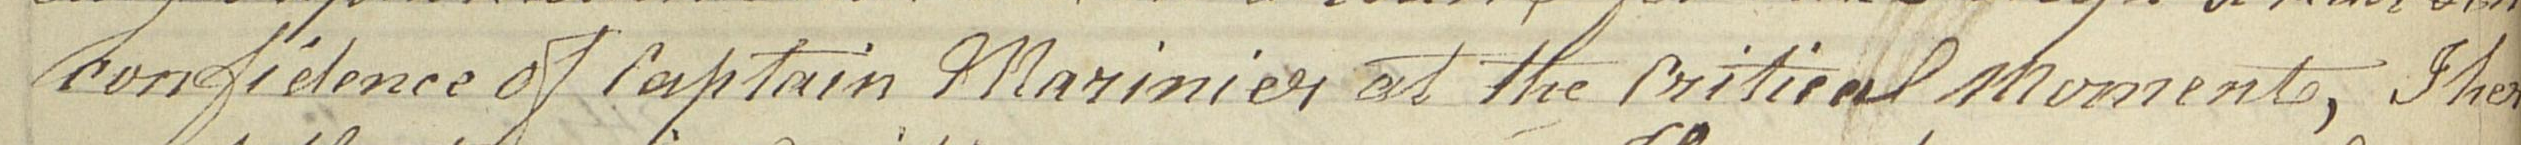confidence of Captain Marinier at the critical moment, I her-
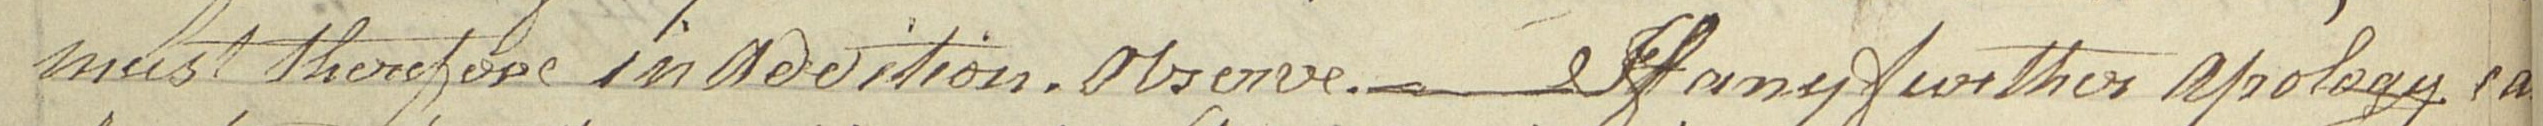must therefore in addition observe. If any further apology ca-
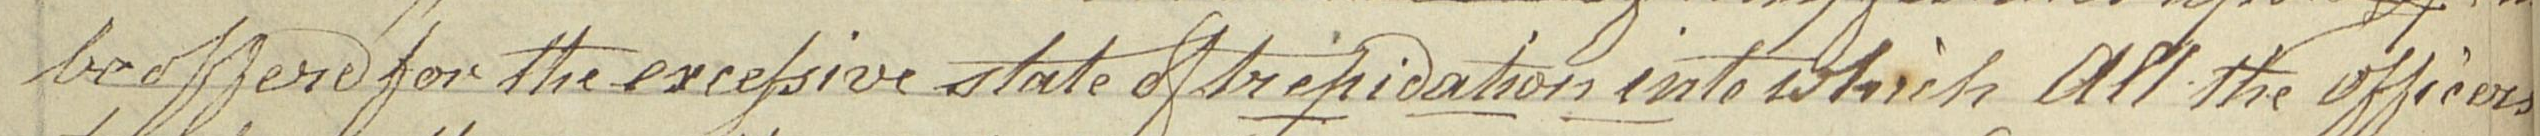be offerd for the excessive state of trepidation into which All the officers
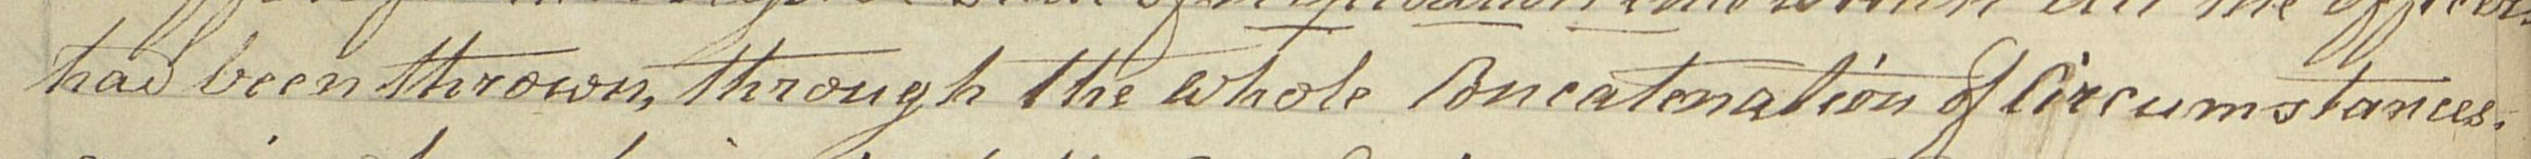had been thrown, through the whole Oncatenation of Circumstnces.
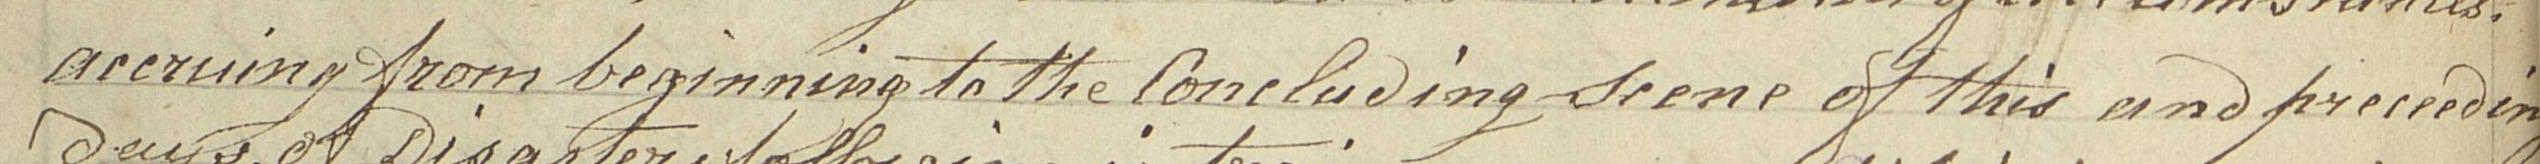accruing from beginning to the Concluding scene of this and preceeding
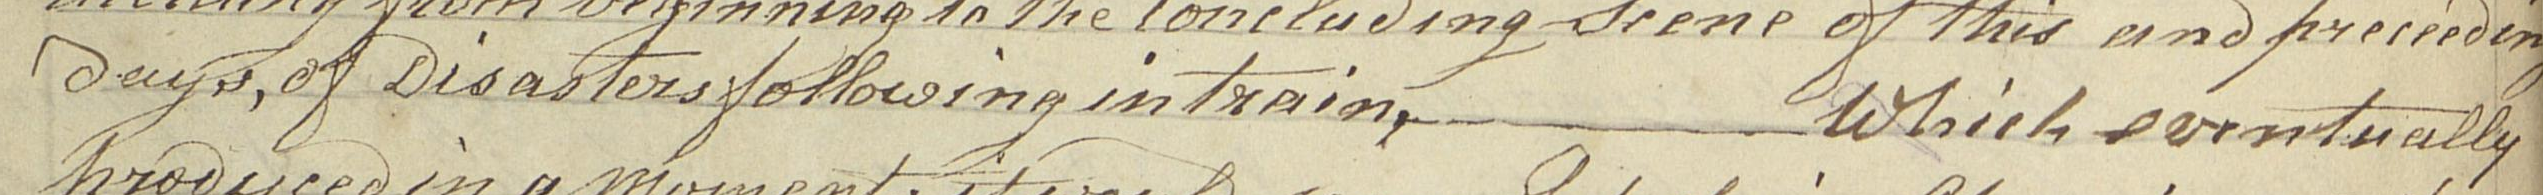days, of Disasters followingin train, Which eventually
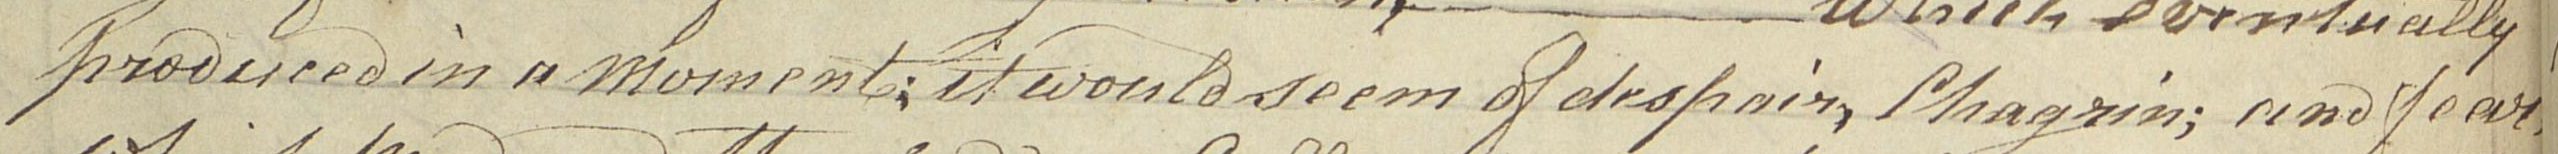produced in a moment; it would seem of despair, Chagrin; and fear
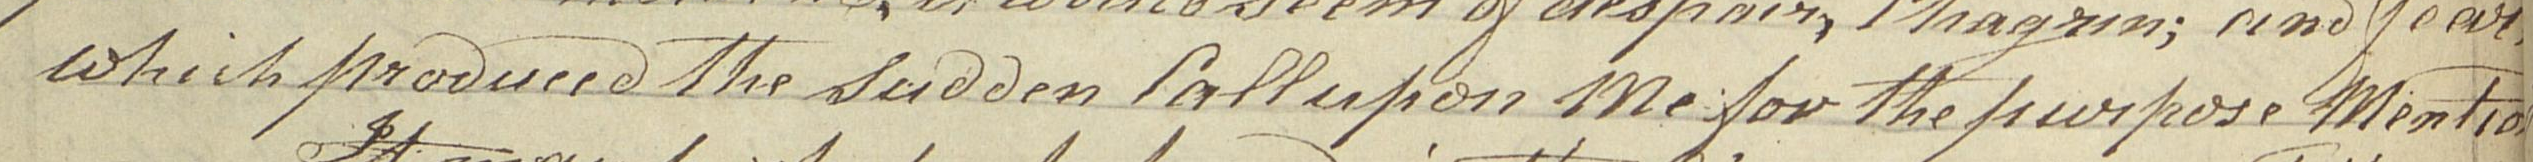which produced the sudden call upon me for the purpose mentio-
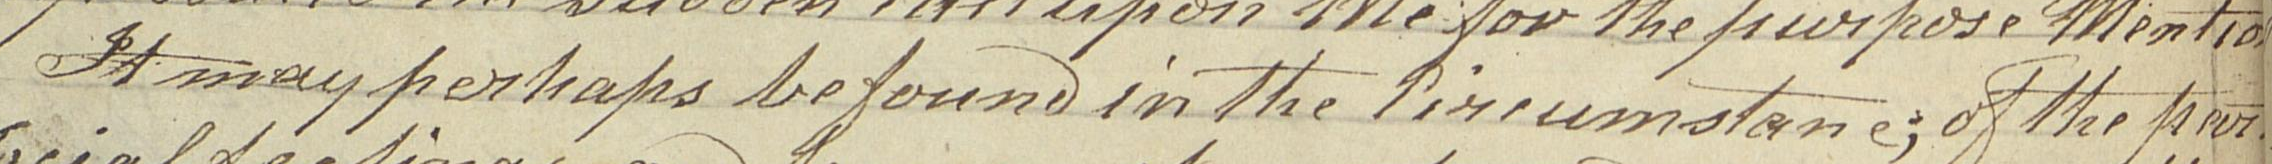It may perhaps be found in the Circumstance; of the par-
